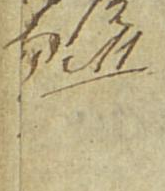PM
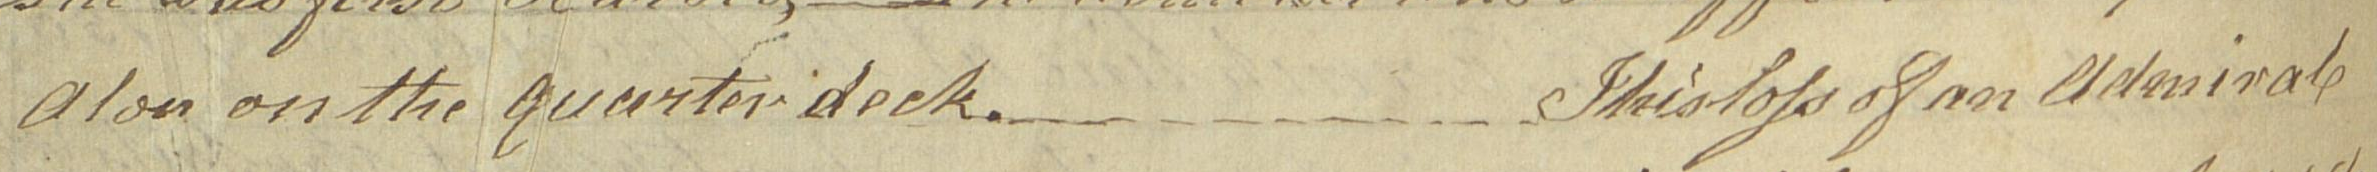Alon on the quarter deck. This loss of an Admiral
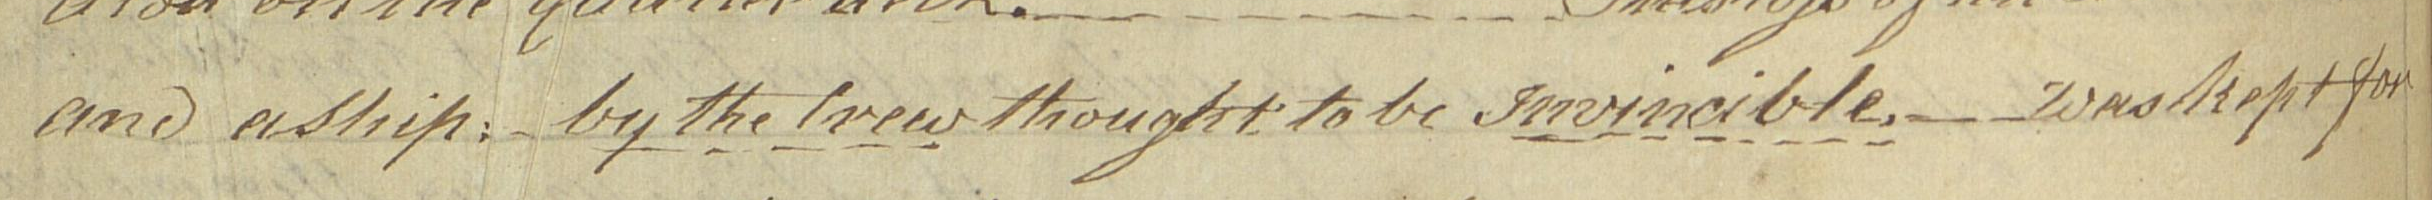and a ship; by the Crew thought to be invincible, was kept for
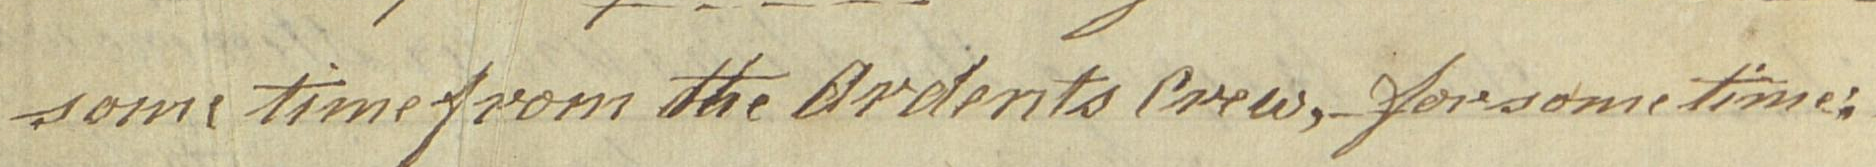some time from the Ardents crew, for sometime:
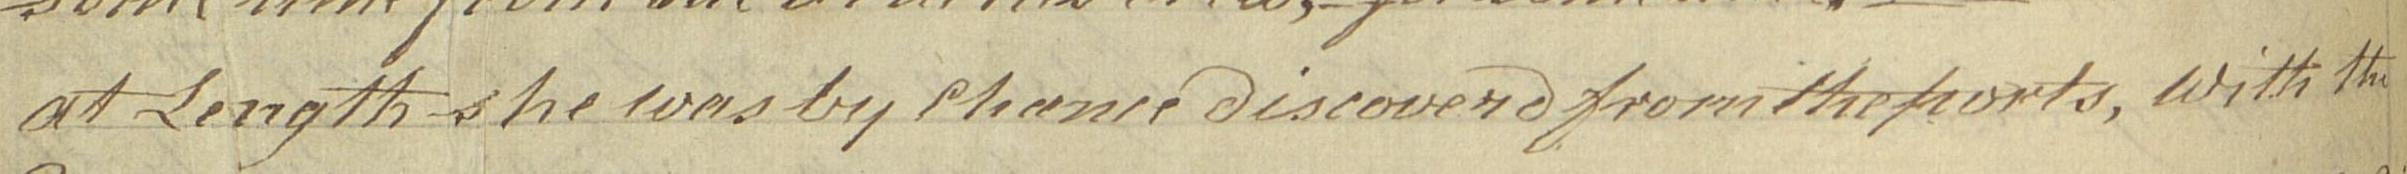at Length she was by Chance discoverd from the ports, with the
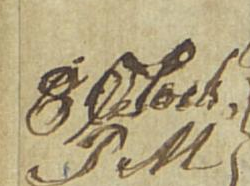8 OClock
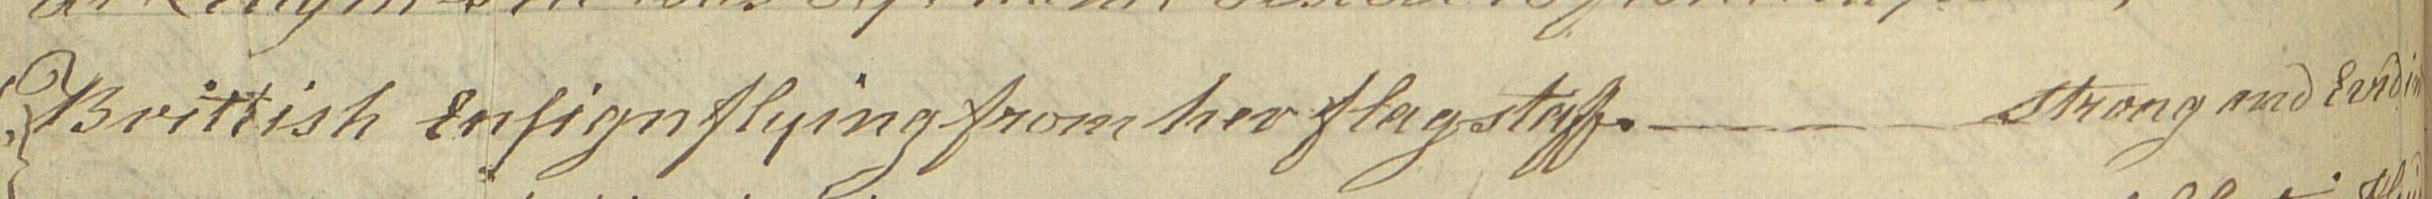Brittish Ensign flying from her flagstaff. Strong and Evid-
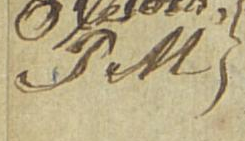PM
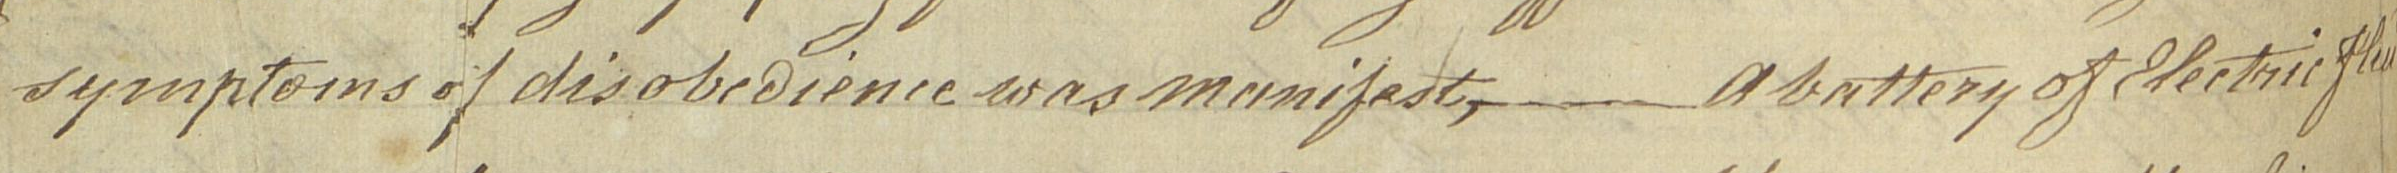symptoms of disobedience was manifest, A battery of Electric fl
